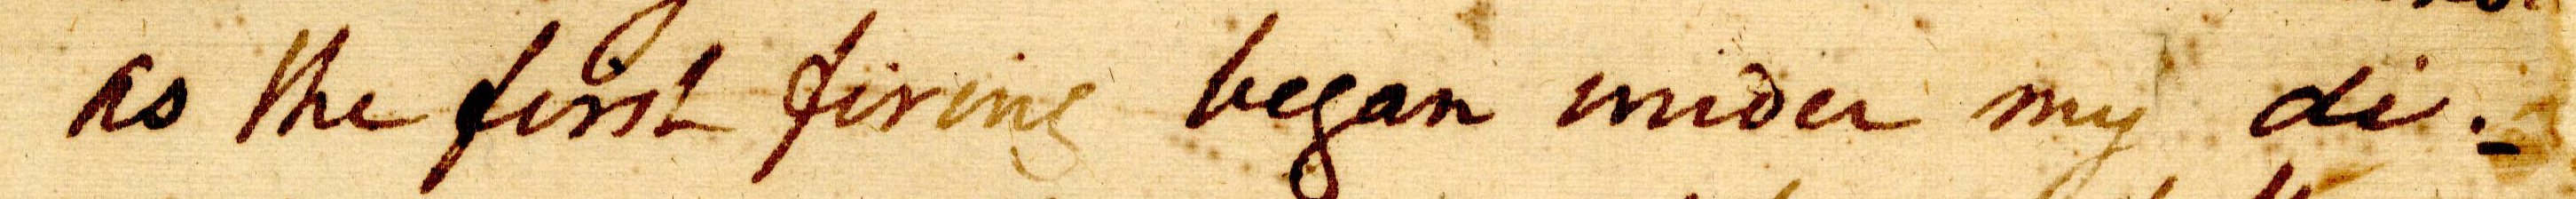as the first firing began under my di-
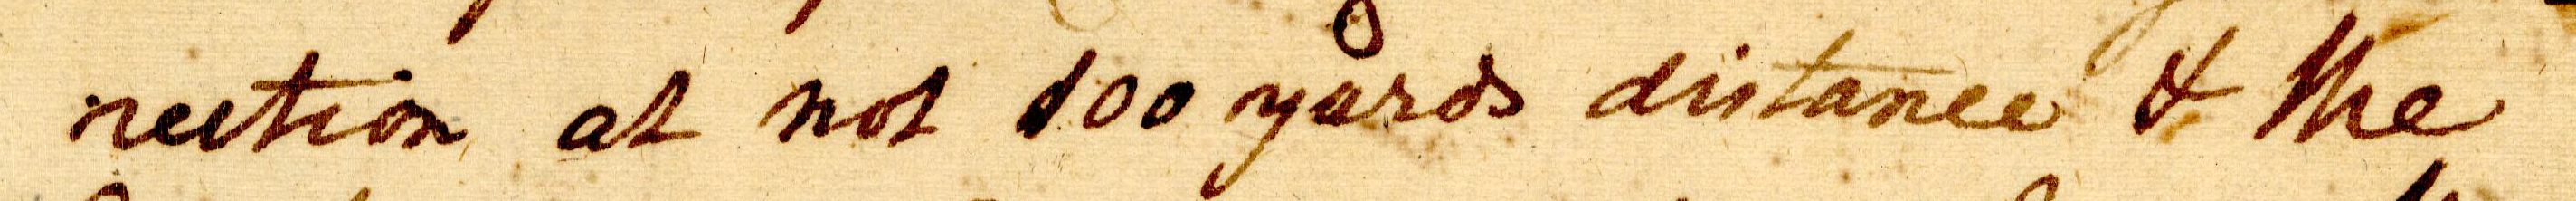rection at not 100 yards distance & the
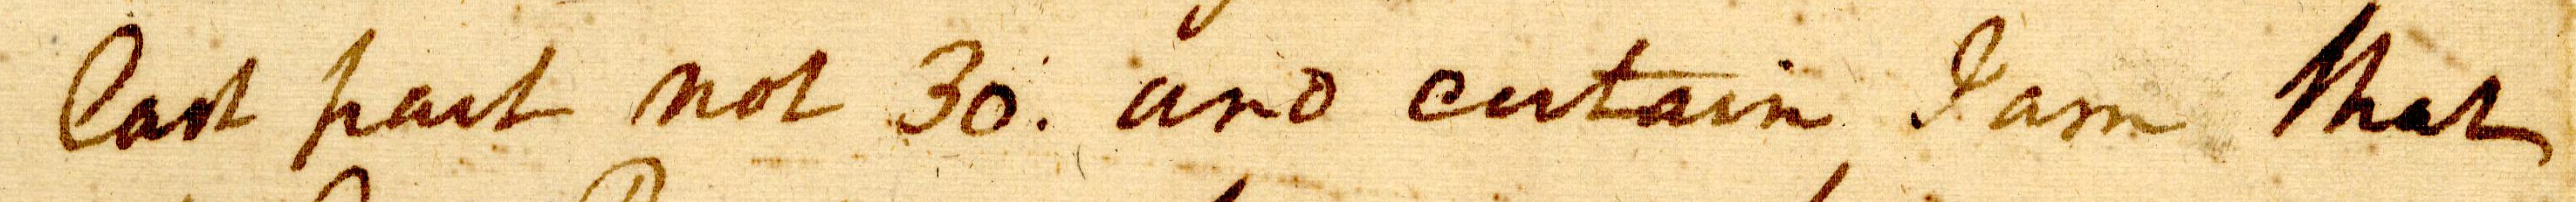last part not 30 and certain I am that
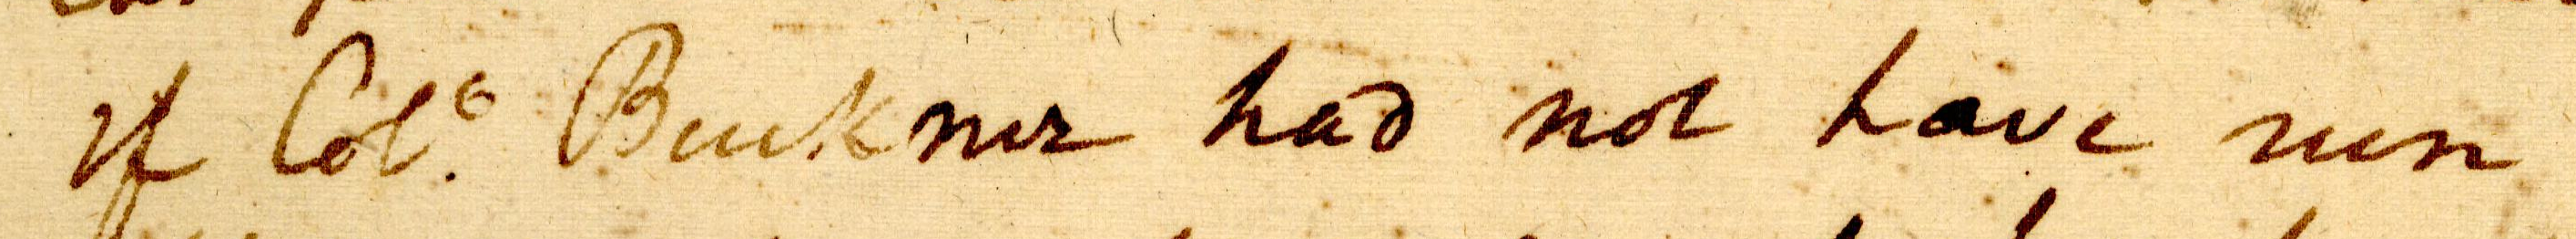if Col^o. Buckner had not have run
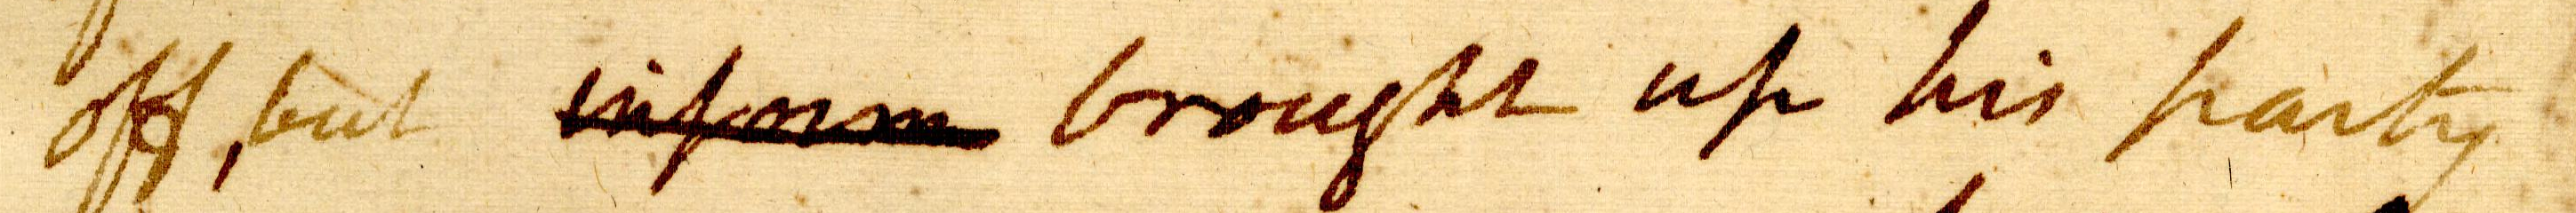off, but [inform] brought up his party
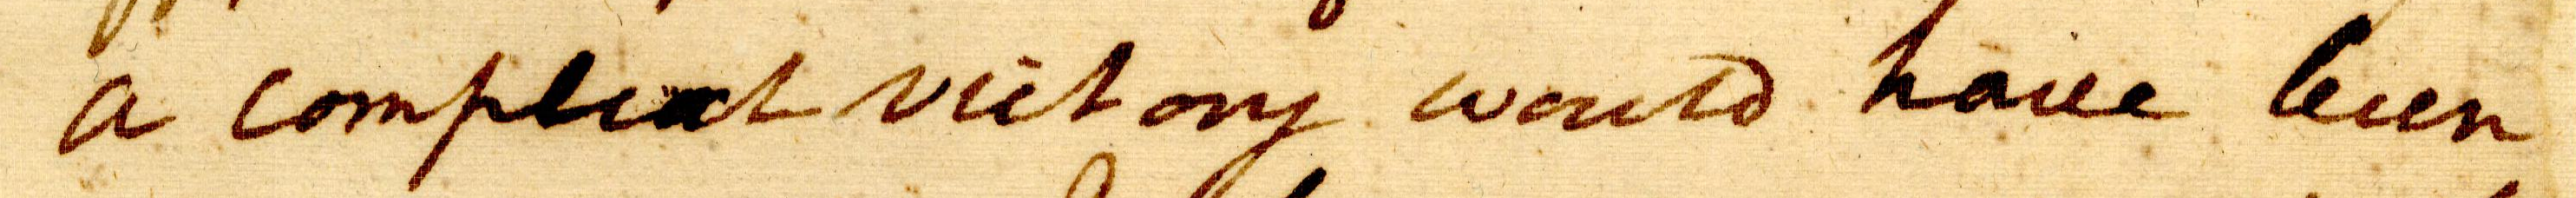a compleat victory would have been
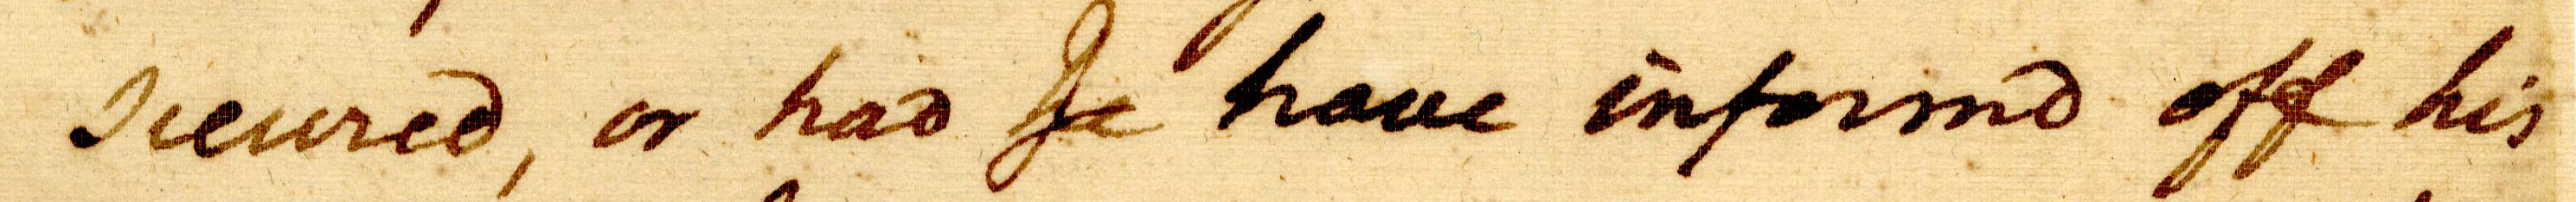secured, or had I have informd off his
